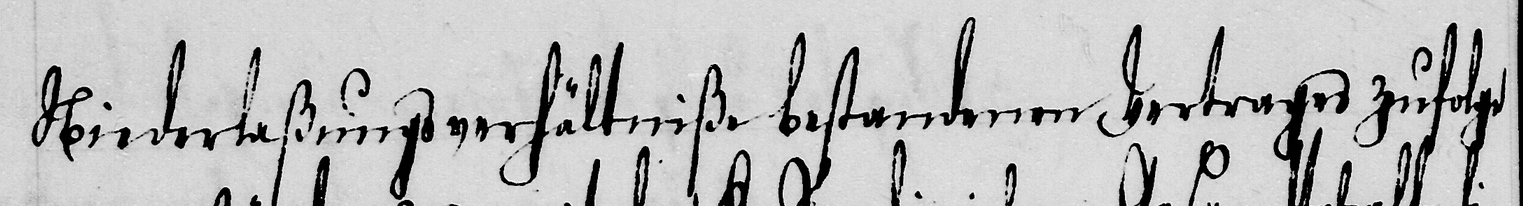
Niederlaßungsverhältniße bestandenen Vertrages zufolge
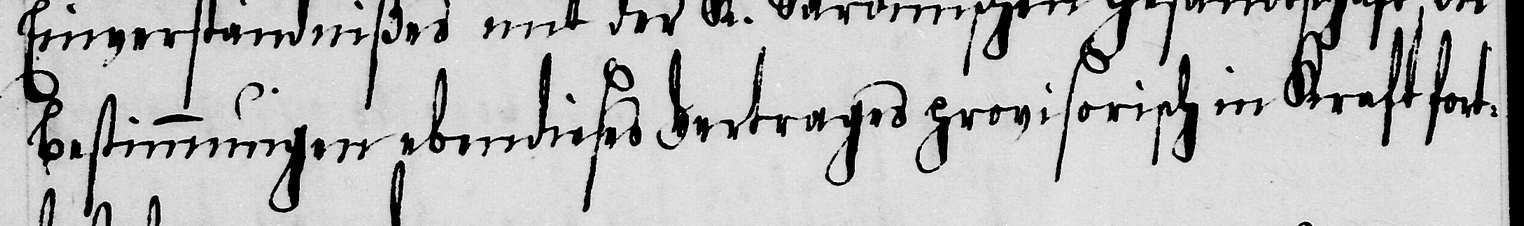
Bestimmungen ebendieses Vertrages provisorisch in Kraft for¬
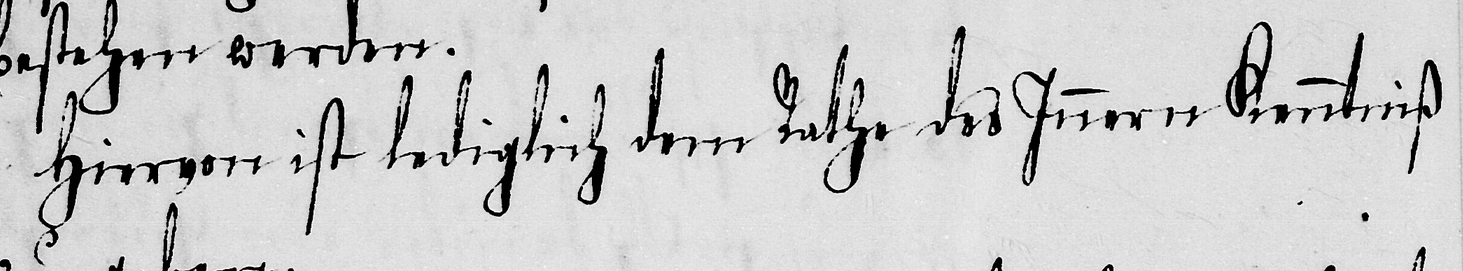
Hiervon ist lediglich dem Rathe des Innern Kenntniß
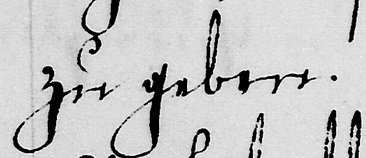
zu geben.
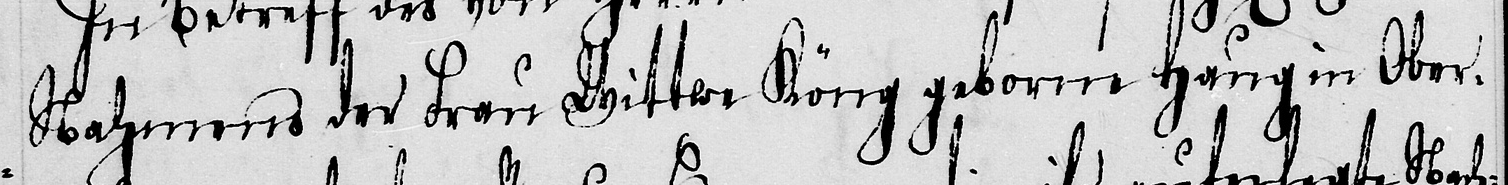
Nahmens der Frau Wittwe Köng geborne Haug in Ober¬
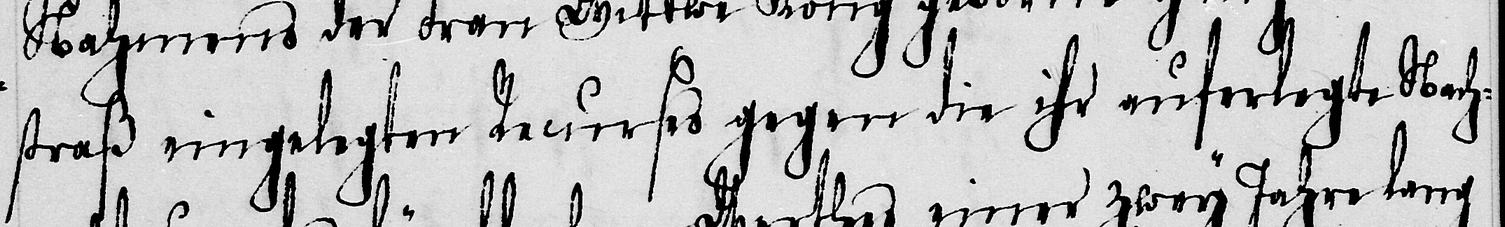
straß eingelegten Recurses gegen die ihr auferlegte Nac¬
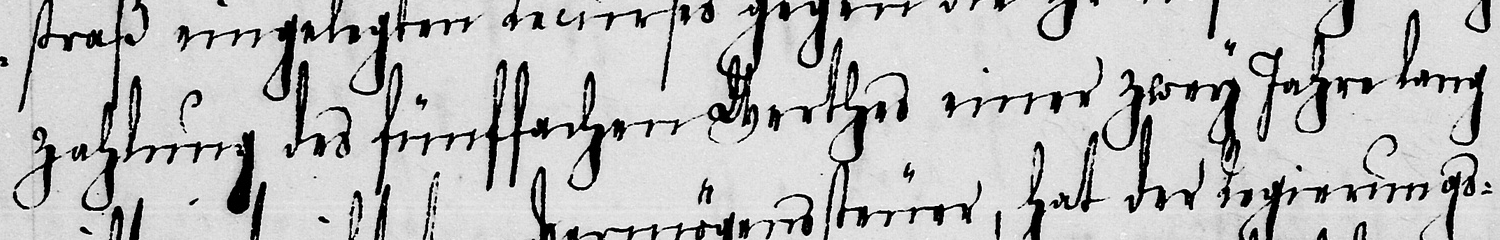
hzahlung des fünffachen Werthes einer zwey Jahre lang
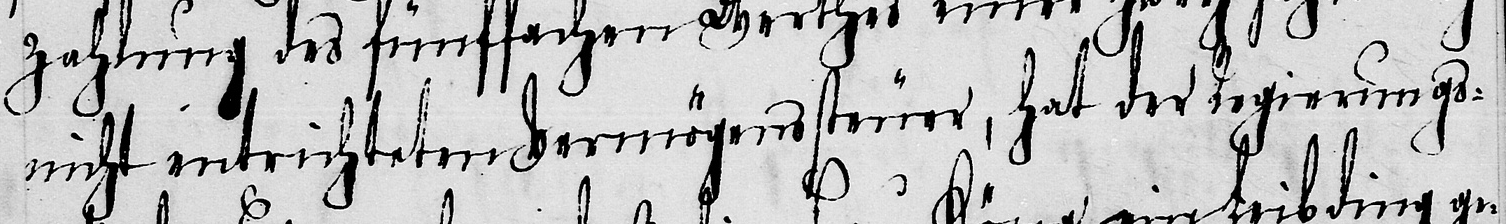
nicht entrichteten Vermögenssteuer, hat der Regierungs¬
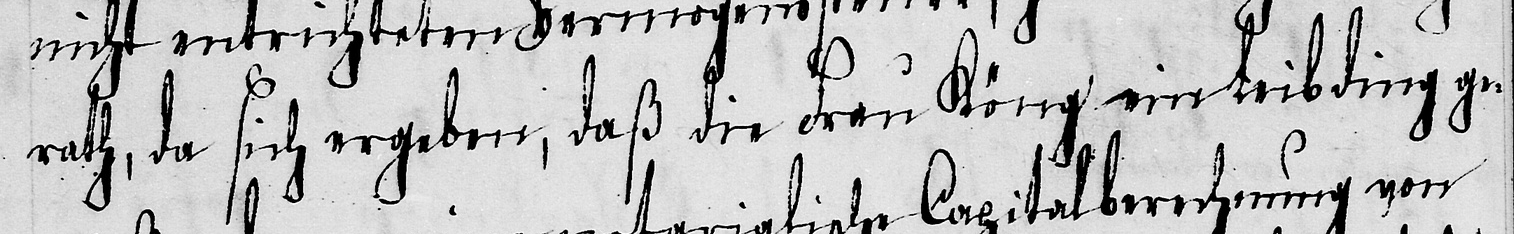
rath, da sich ergeben, daß die Frau Köng ein Leibding ge¬
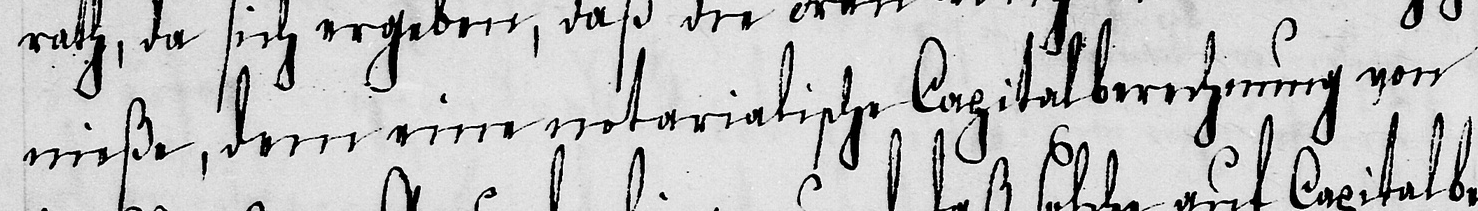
nieße, dem eine notarialische Capitalberechnung von
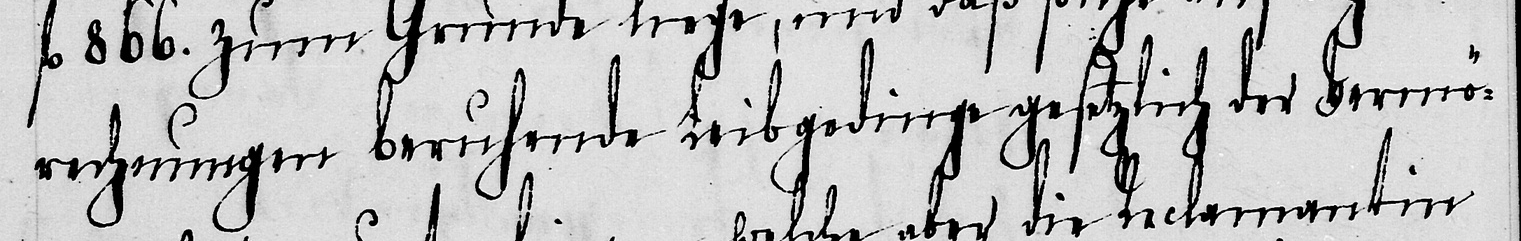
rechnungen beruhende Leibgedinge gesetzlich der Ve¬
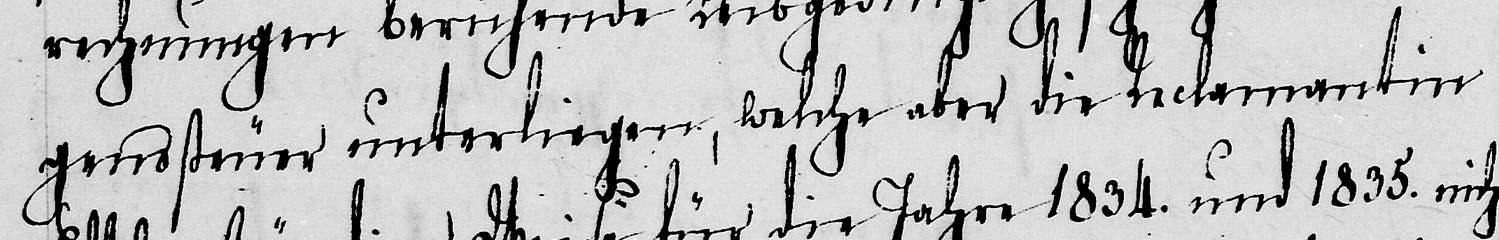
genssteuer unterliegen, welche aber die Reclamantin
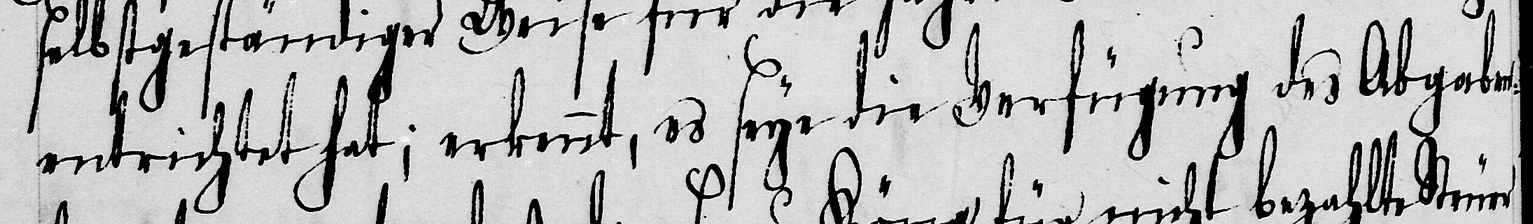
entrichtet hat; erkennt, es seye die Verfügung des Abgabe¬
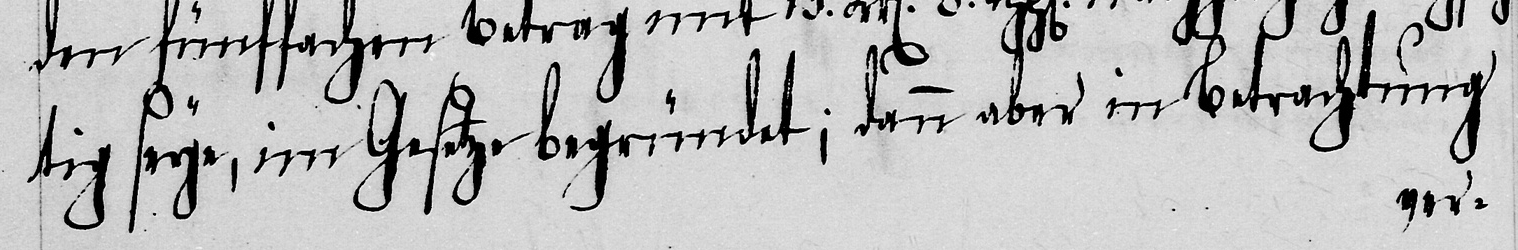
tig seye, im Gesetze begründet; dann aber in Betrachtung
